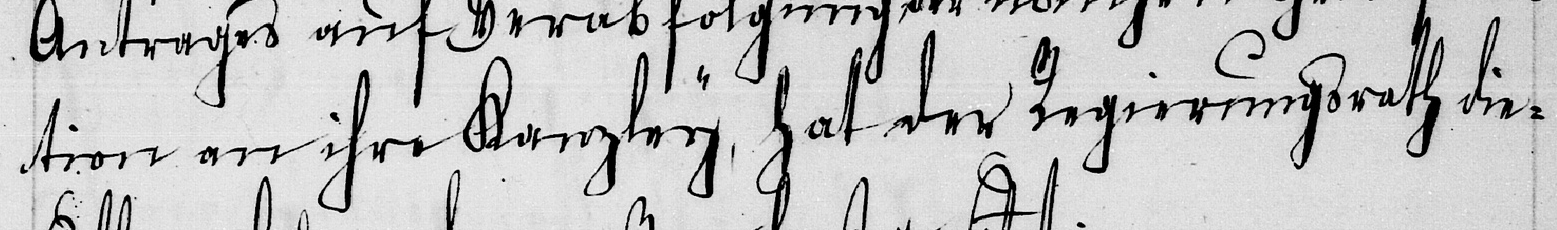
tion an ihre Kanzley, hat der Regierungsrath die¬
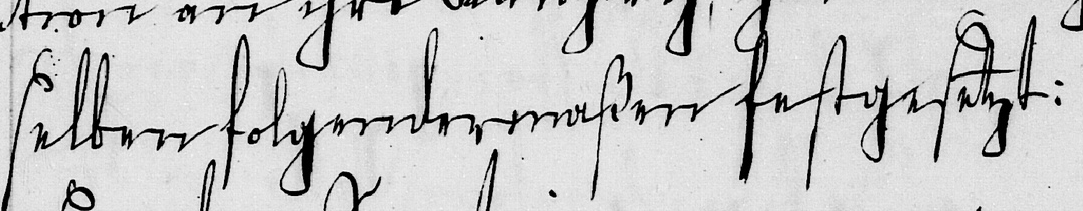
selben folgendermaßen festgesetzt:
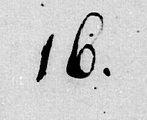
16.
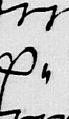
32.
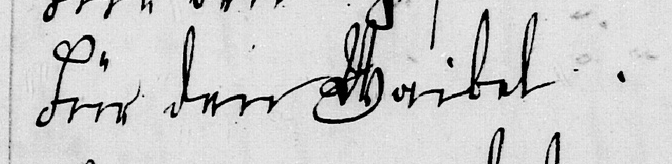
Für den Waibel
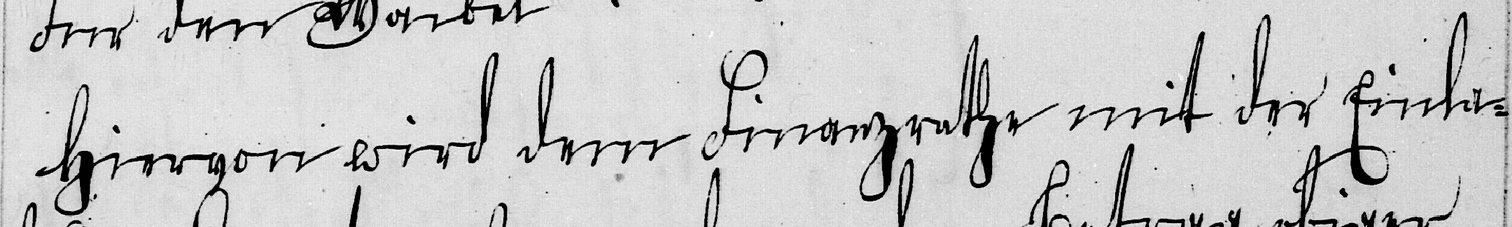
Hiervon wird dem Finanzrathe mit der Einla¬
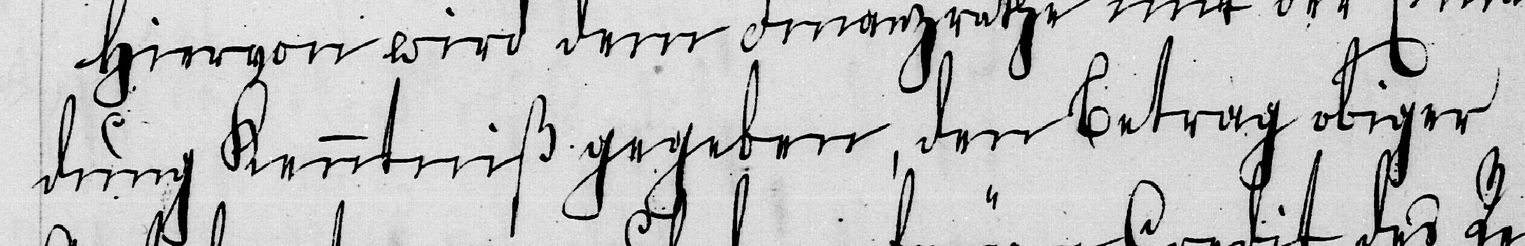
dung Kenntniß gegeben, den Betrag obiger
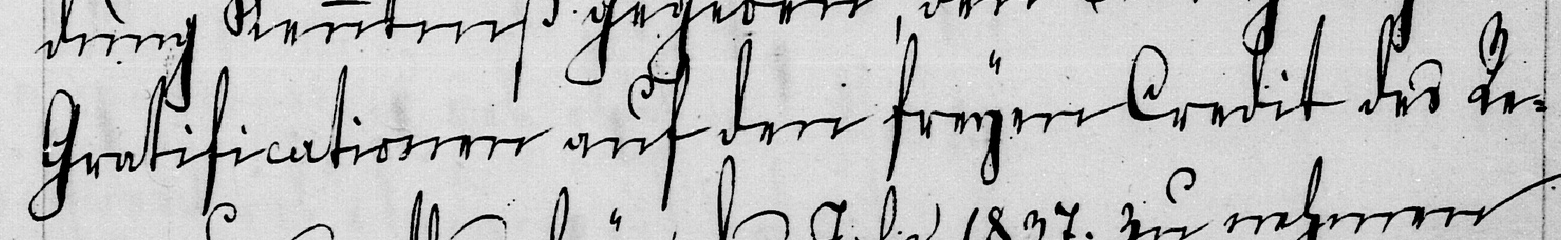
Gratificationen auf den freyen Credit des Re¬
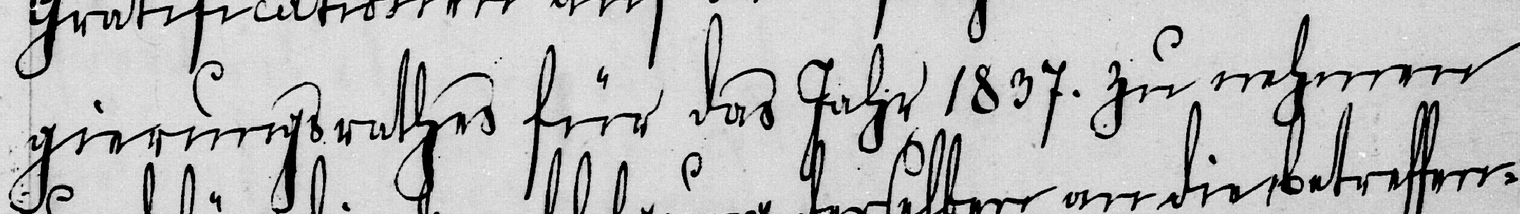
gierungsrathes für das Jahr 1837. zu nehmen
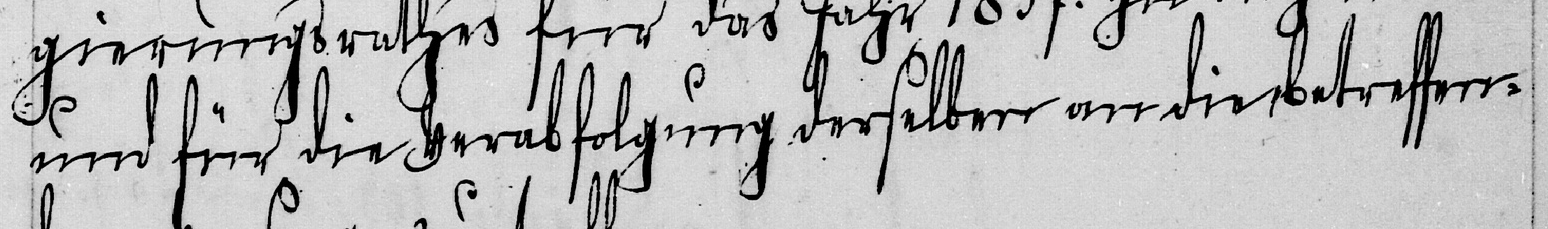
und für die Verabfolgung derselben an die betreffen¬
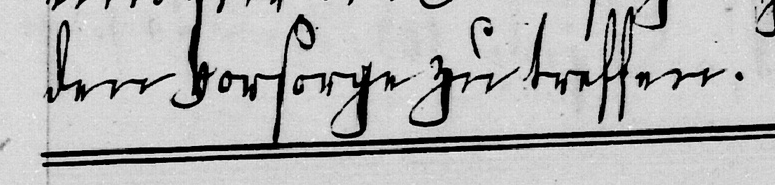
den Vorsorge zu treffen.
